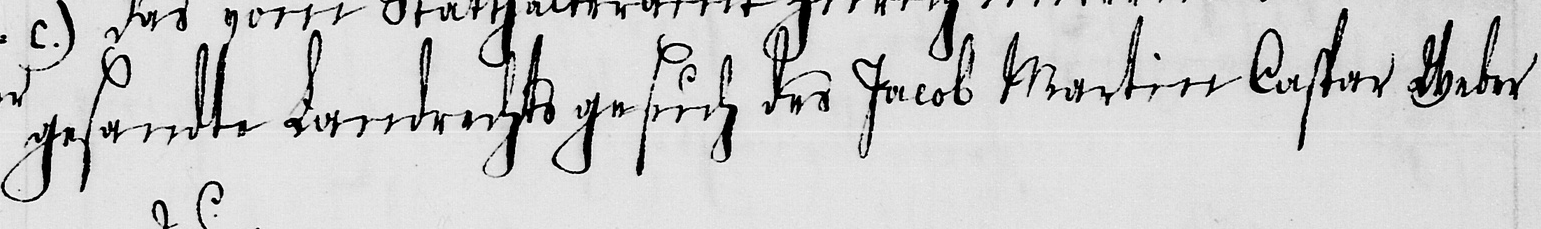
gesandte Landrechtsgesuch des Jacob Martin Caspar Weber
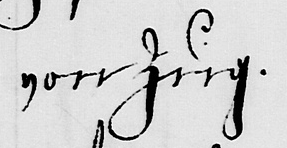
von Zug.
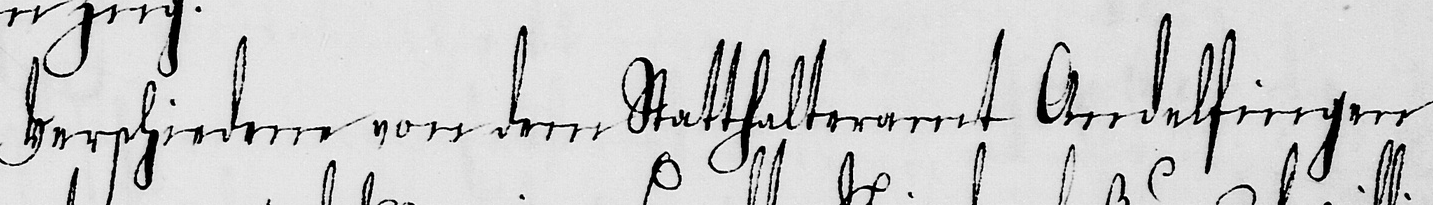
Verschiedene von dem Statthalteramt Andelfingen
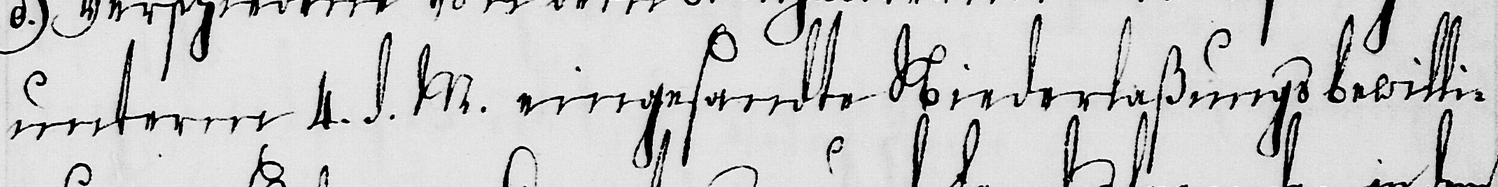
unterm 4. d. M. eingesandte Niederlaßungsbewill¬
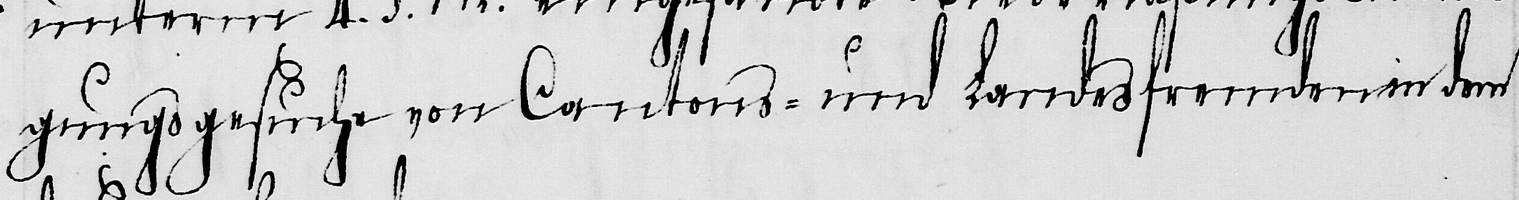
igungsgesuche von Cantons- und Landesfremden in dem
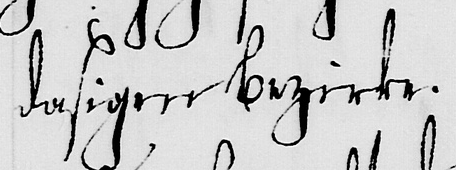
dasigen Bezirke.
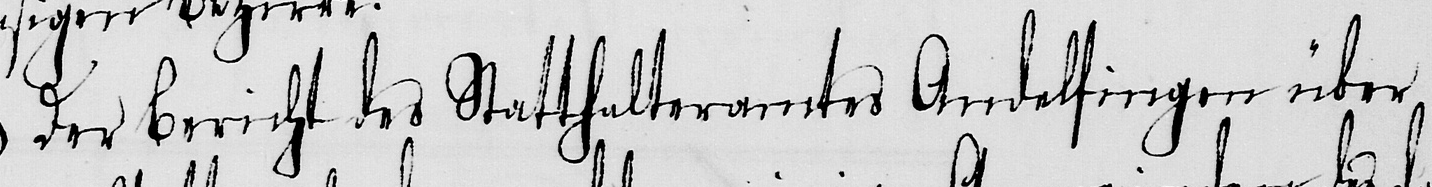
Der Bericht des Statthalteramtes Andelfingen über
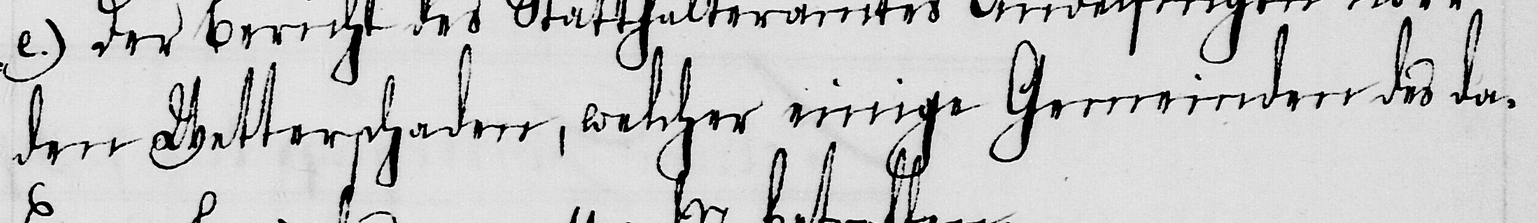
den Wetterschaden, welcher einige Gemeinden des da¬
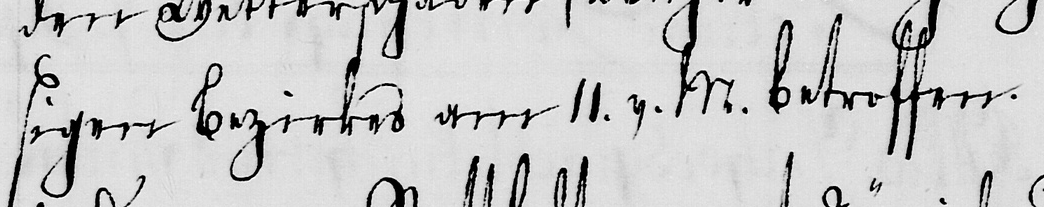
sigen Bezirkes am 11. v. M. betroffen.
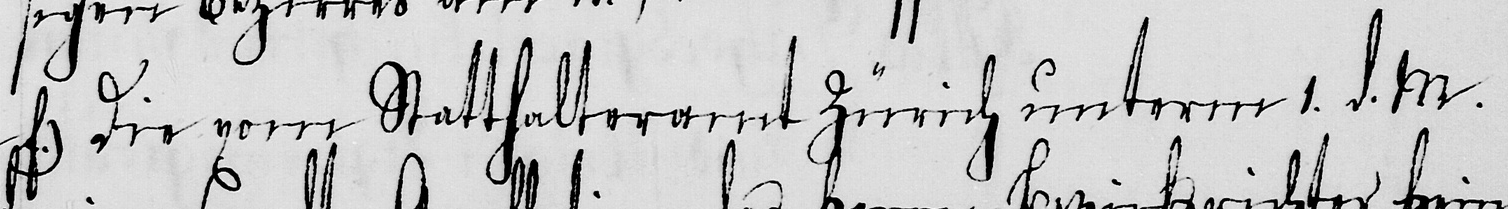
f.) Die vom Statthalteramt Zürich unterm 1. d. M.
